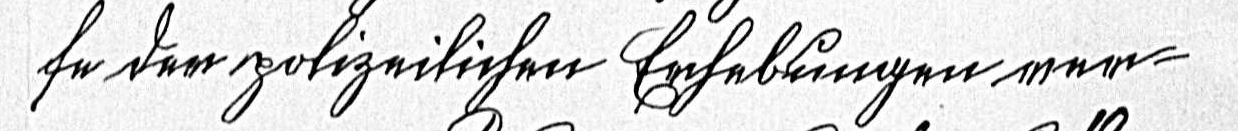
fe der polizeilichen Erhebungen ver¬
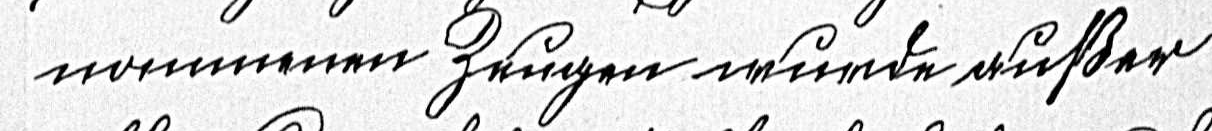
nommenen Zeugen wurde außer
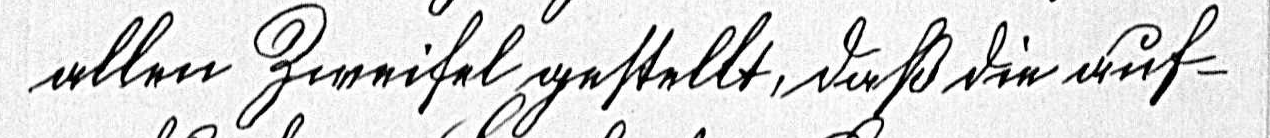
allen Zweifel gestellt, daß die auf¬
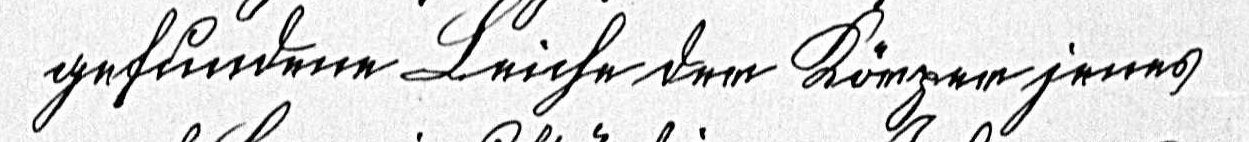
gefundene Leiche der Körper jenes
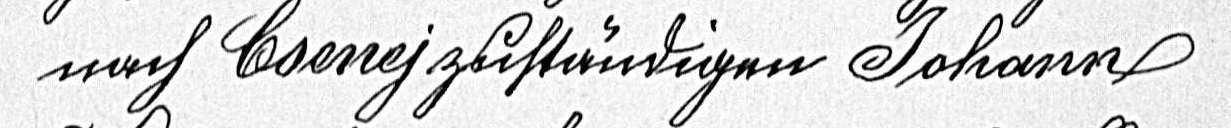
nach Csenej zuständigen Johann
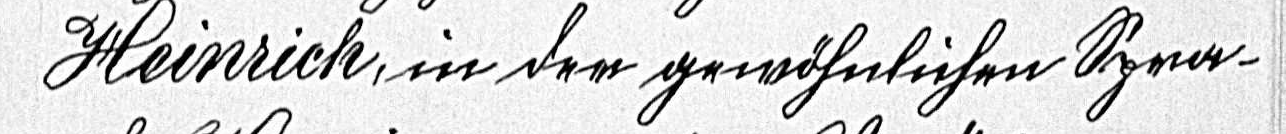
Heinrich, in der gewöhnlichen Spra¬
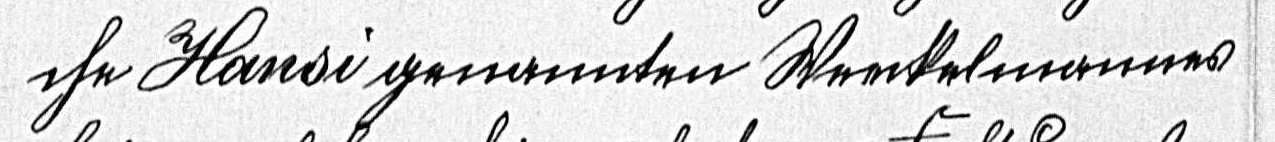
che Hansi genanntenWerkelmannes
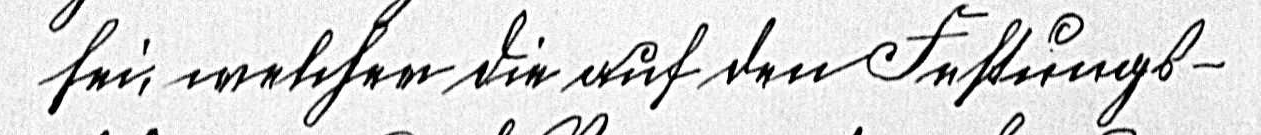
sei, welcher die auf den Festungs¬
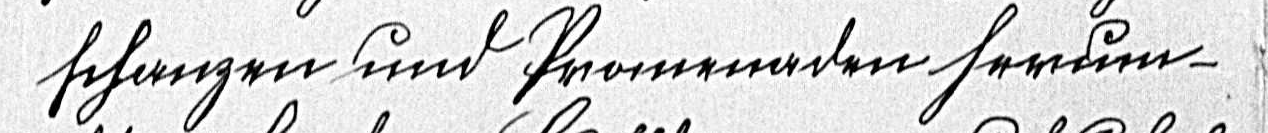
schanzen und Promenaden herum¬
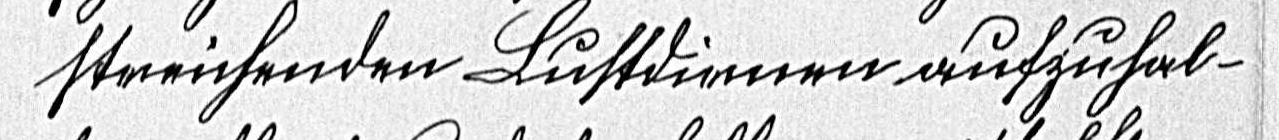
streichenden Lustdirnen aufzuhal¬
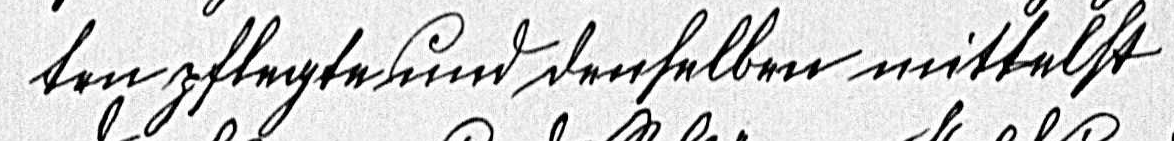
ten pflegte und denselben mittelst
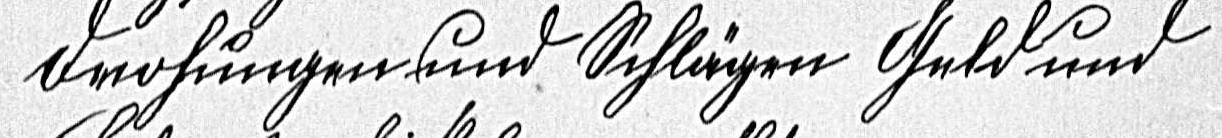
Drohungen und Schlägen Geld und
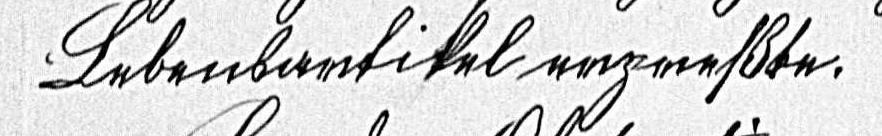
Lebensartikel erpreßte.
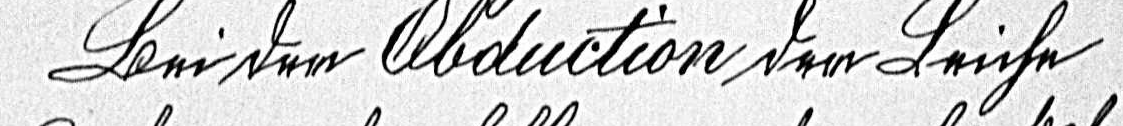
Bei der Obduction der Leiche
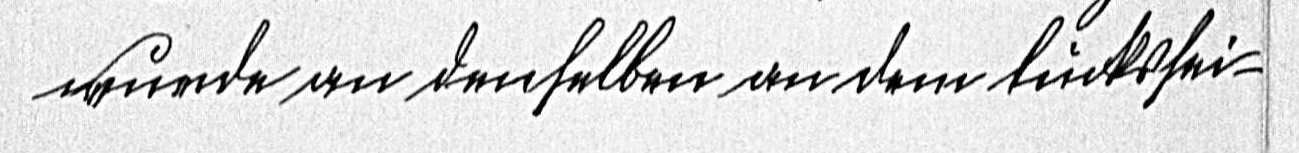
wurde an denselben an dem linkssei¬
